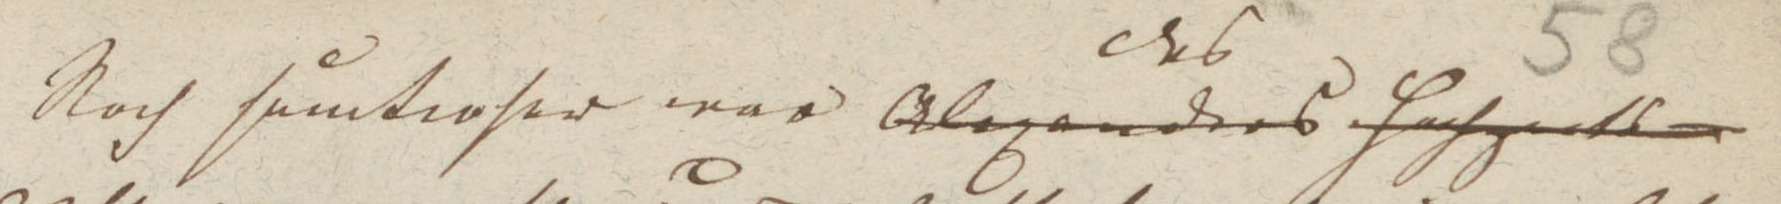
Noch sumtioser war Alexanders das Hochzeits-
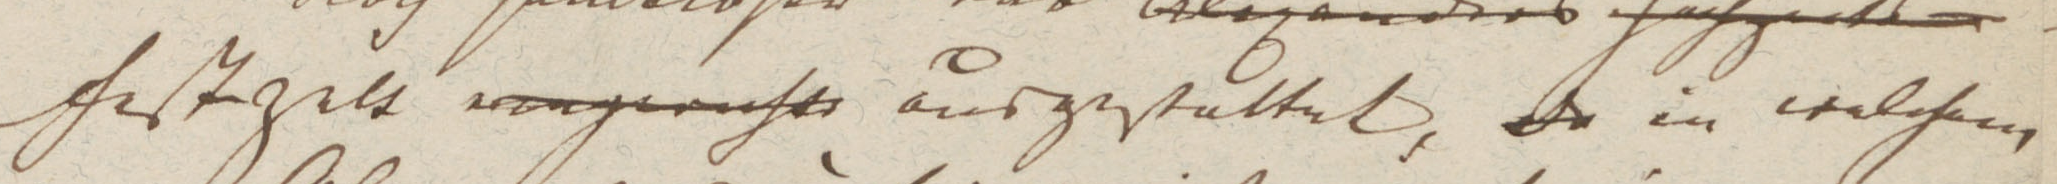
Festzelt eingericht ausgestattet, d in welchem
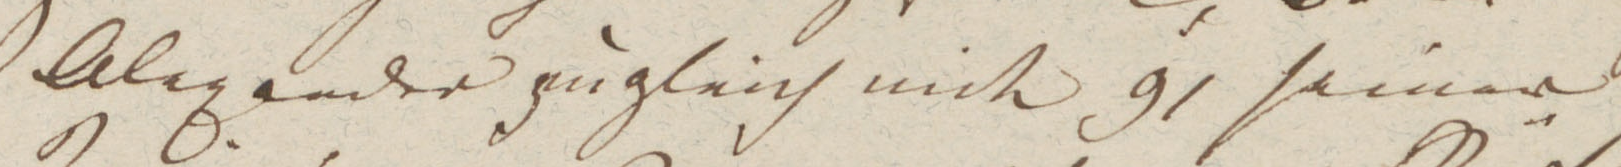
Alexander zugleich mit 91 seiner
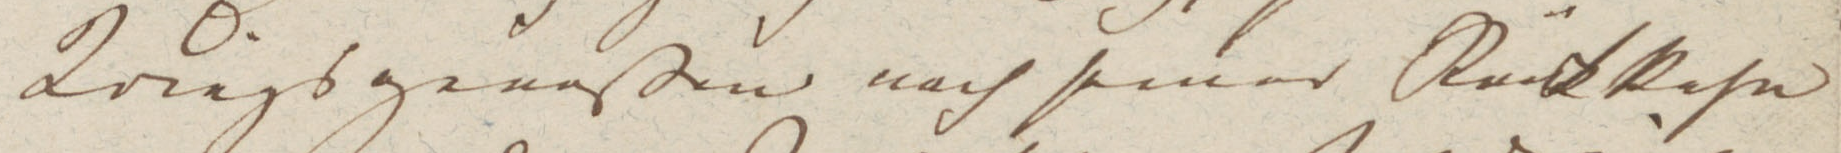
Kriegsgenossen nach seiner Rückkehr
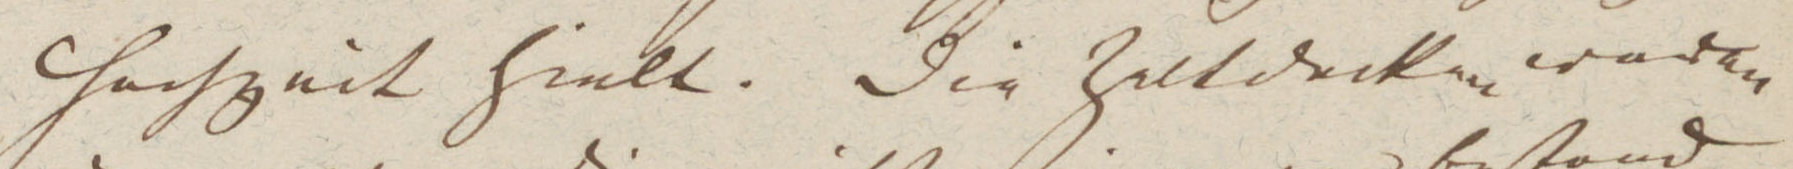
Hochzeit hielt. Die Zeltdecken waren
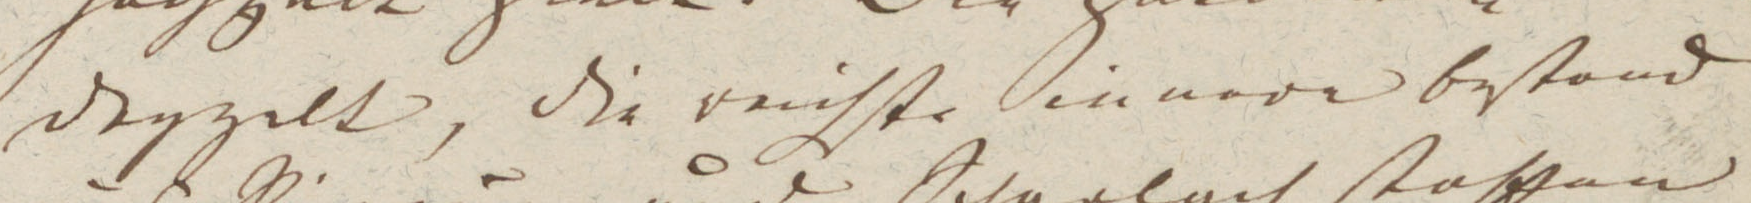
doppelt, die reichste innere bestand
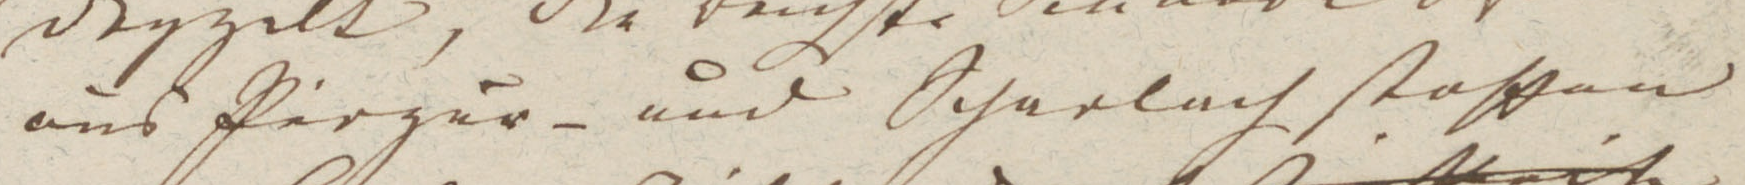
aus Purpur- und Scharlachstoffen
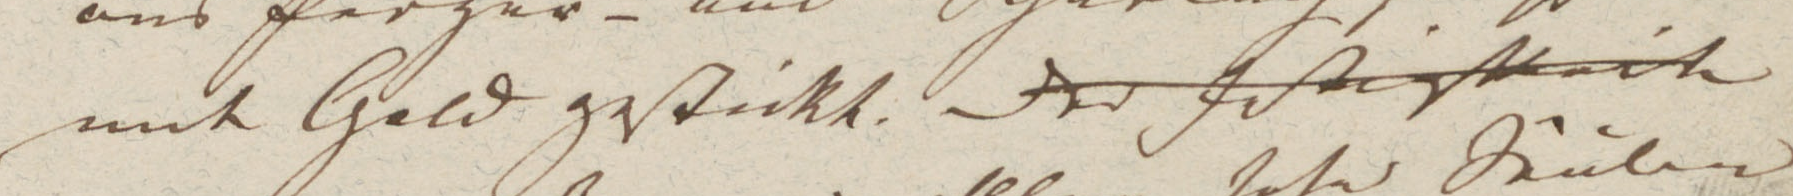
mit Gold gestickt. Der Festigkeit
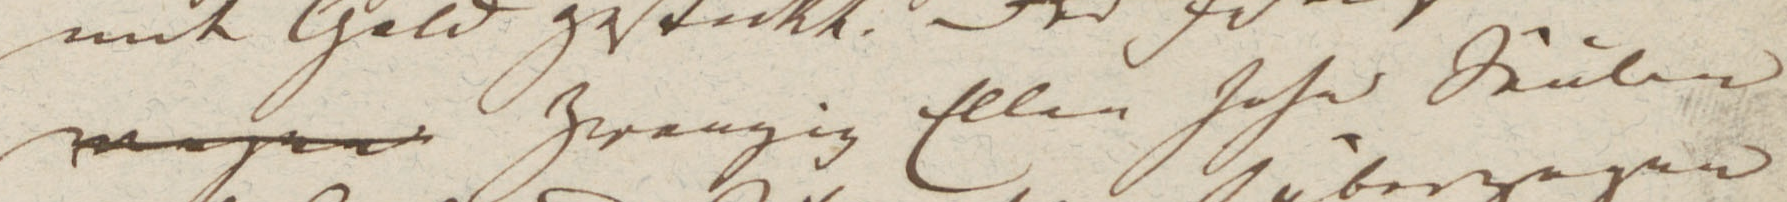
wegen Zwanzig Ellen hohe Säulen
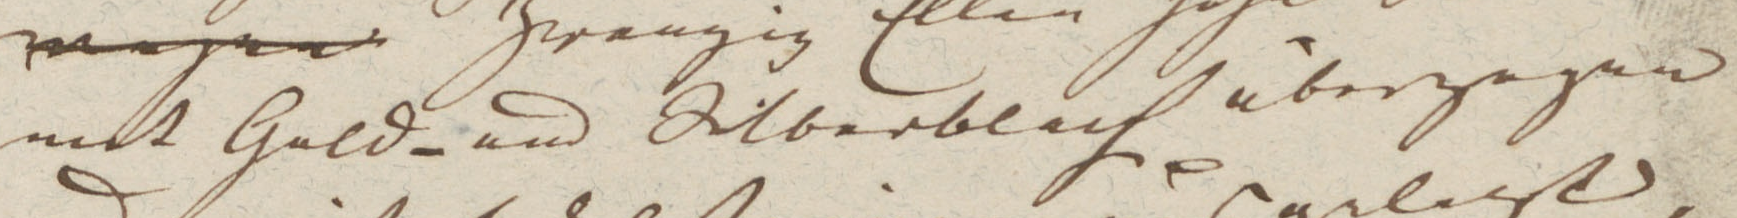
mit Gold- und Silberblech überzogen
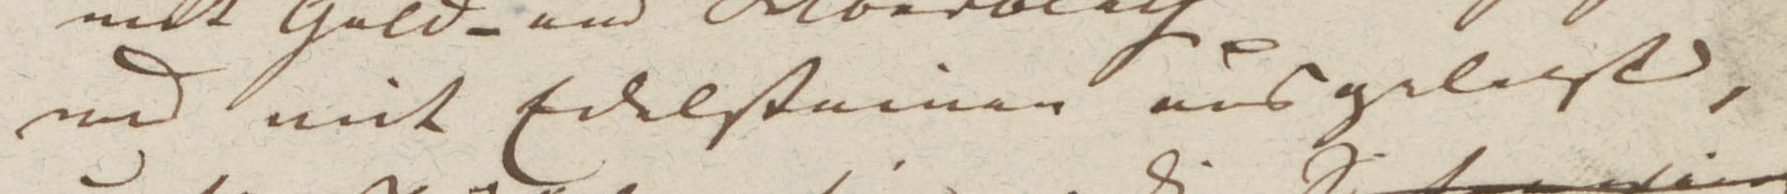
und mit Edelsteinen ausgelegt,
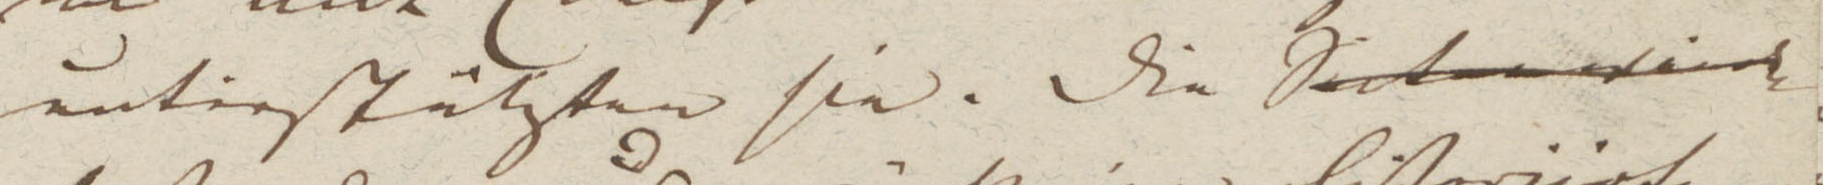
unterstützten sie. Die Seitenwände
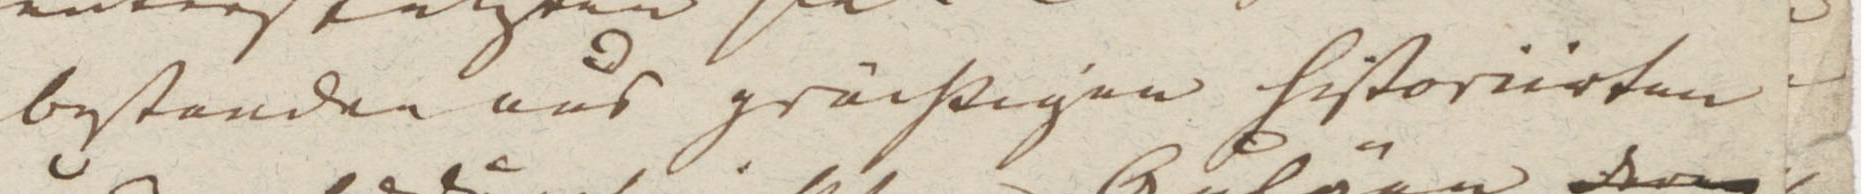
bestanden aus prächtigen historiirten
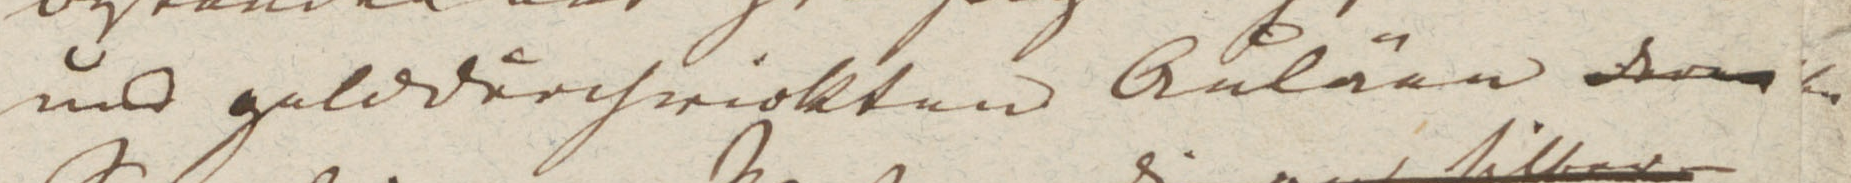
und golddurchwirkten Auläen deren
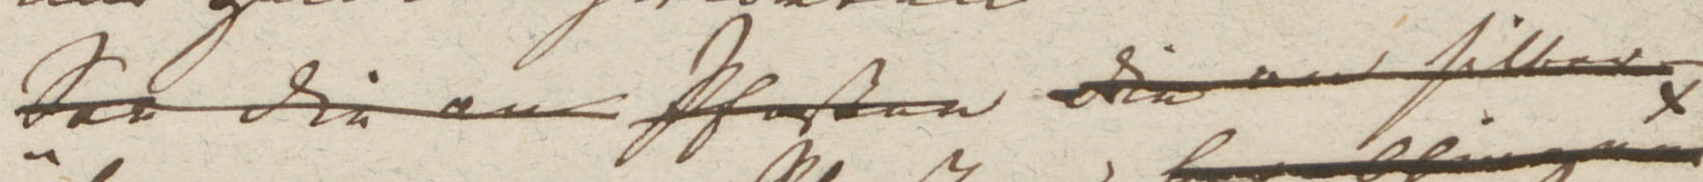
Vor die an Pfosten die an silber-
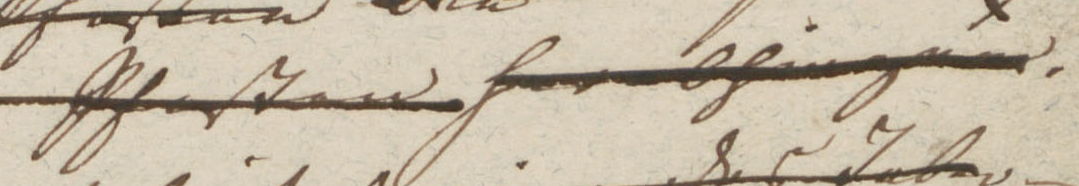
Pfosten herabhingen %.
